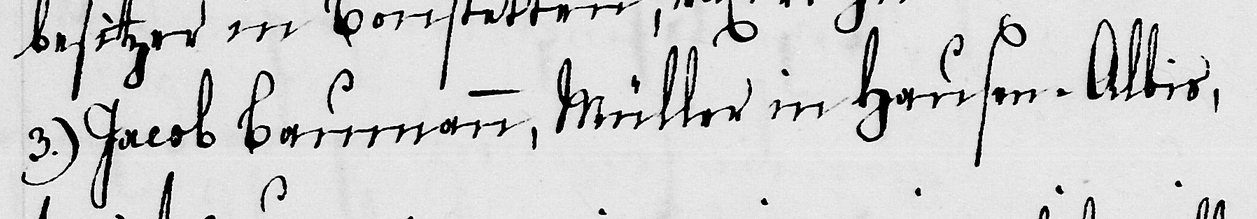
3.) Jacob Baumann, Müller in Hausen-Albis,
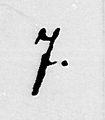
7.
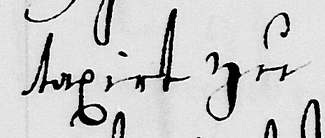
taxirt zu
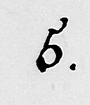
5.
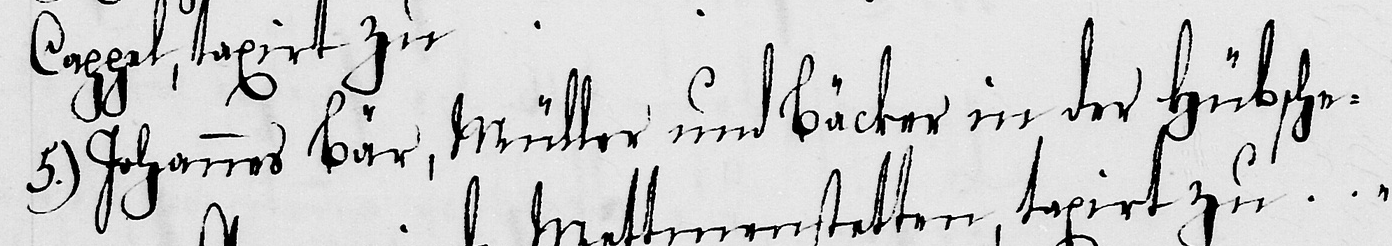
5.) Johannes Bär, Müller und Bäcker in der Hübsche¬
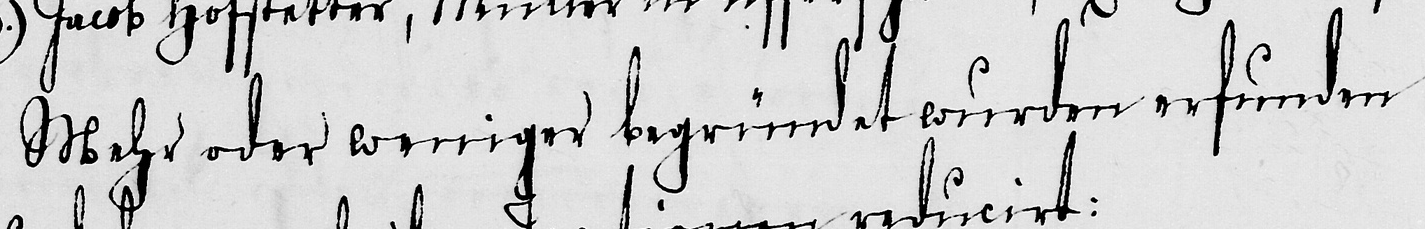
Mehr oder weniger begründet wurden erfunden
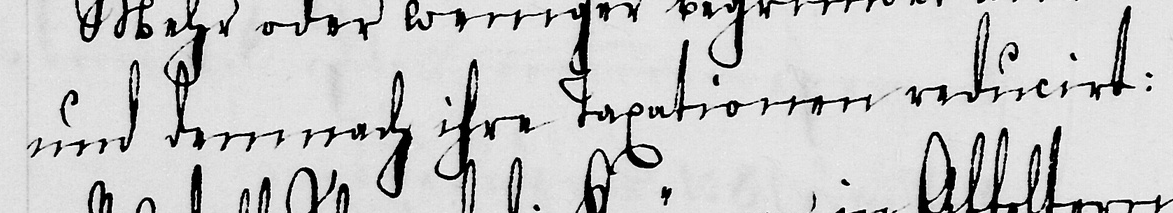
und demnach ihre Taxation reducirt:
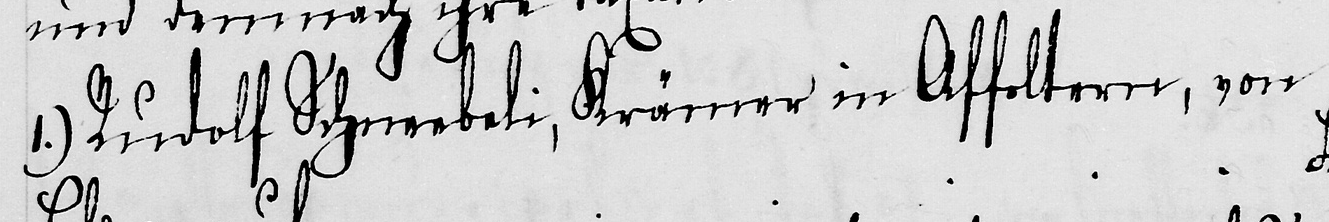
1.) Rudolf Schneebeli, Krämer in Affoltern, von
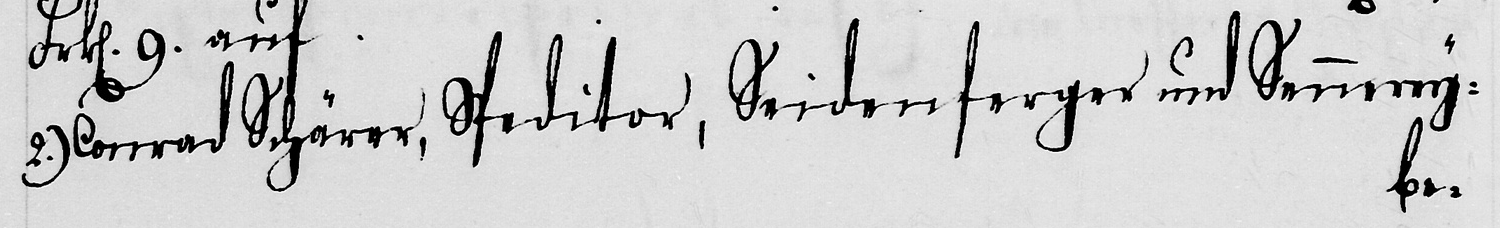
Conrad Schärer, Speditor, Seidenferger und Sennerey-
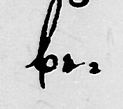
be¬
